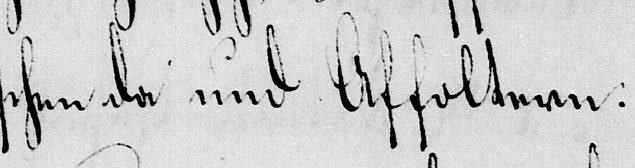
schen da und Affoltern.
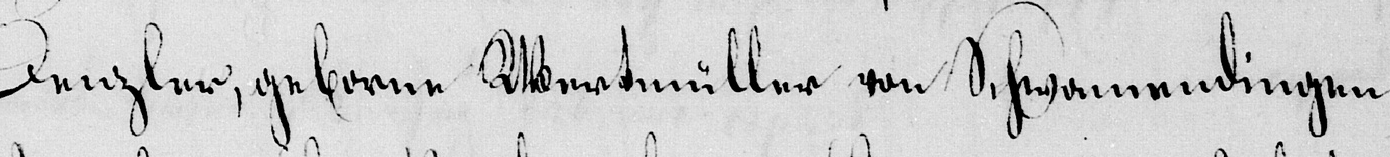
Denzler, geborne Wertmüller von Schwamendingen
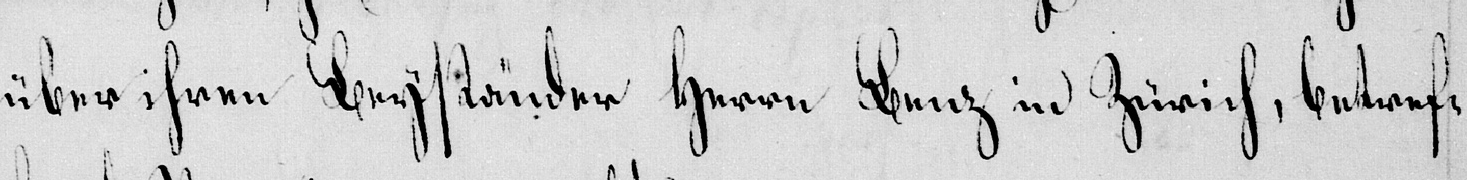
über ihren Beyständer Herrn Kunz in Zürich, betref¬
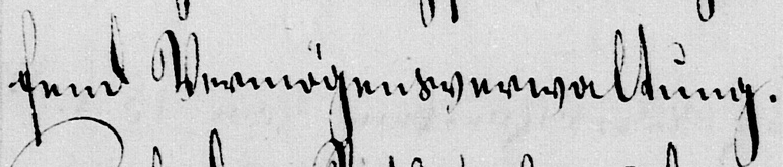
fend Vermögensverwaltung.
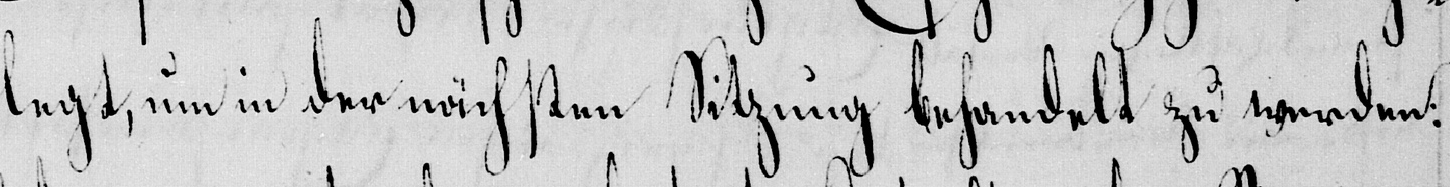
legt, um in der nächsten Sitzung behandelt zu werden:
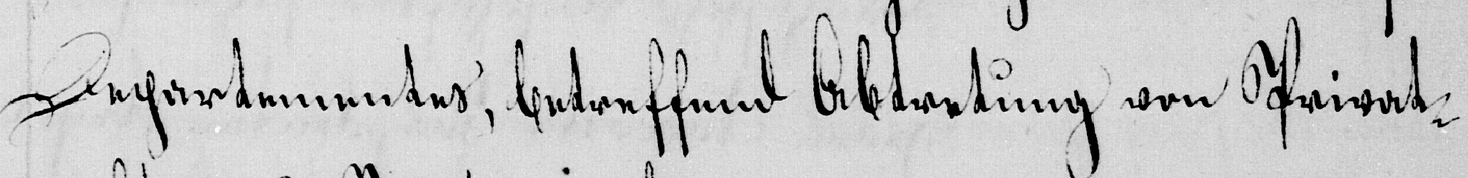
n-Departements, betreffend Abtretung von Privat¬
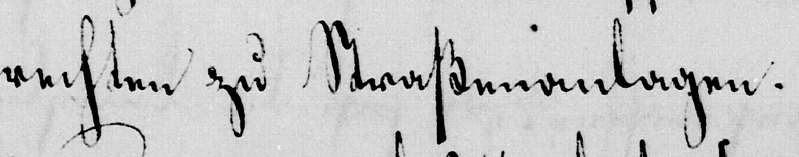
rechten zu Straßenanlagen.
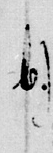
b.)
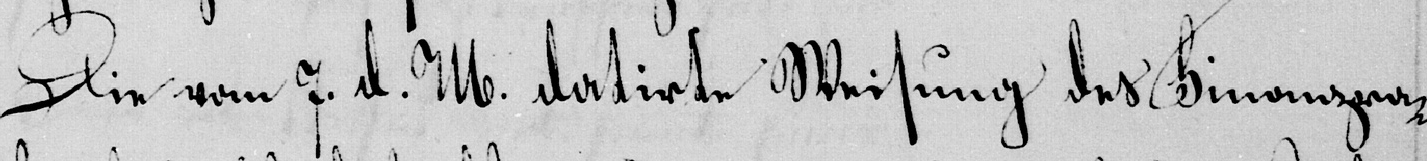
Die vom 7. d. M. datirte Weisung des Finanzra¬
